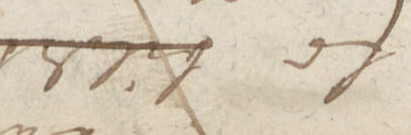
aus diesem reich
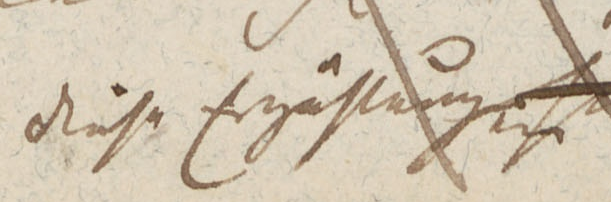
der H Hellenischen
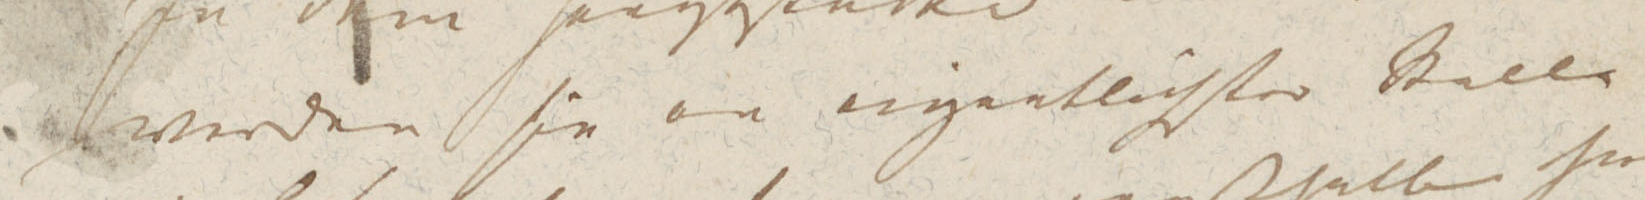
werden sie an eigentlichster Stelle
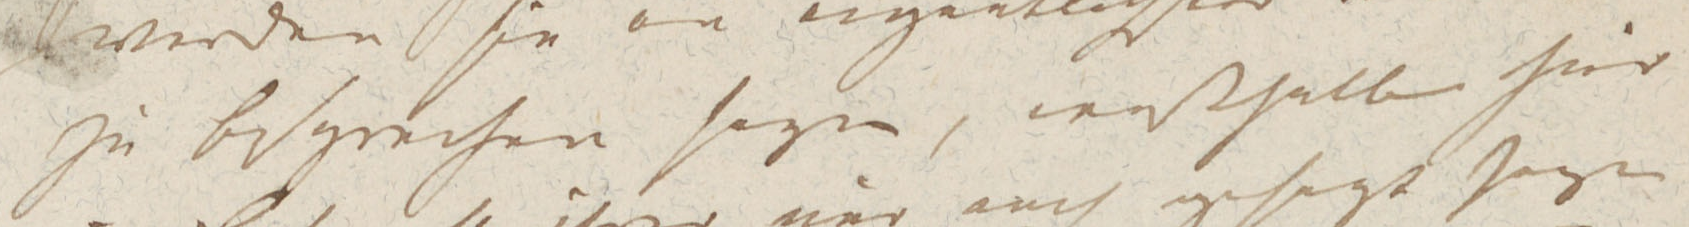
zu besprechen seyn, wesshalb hier
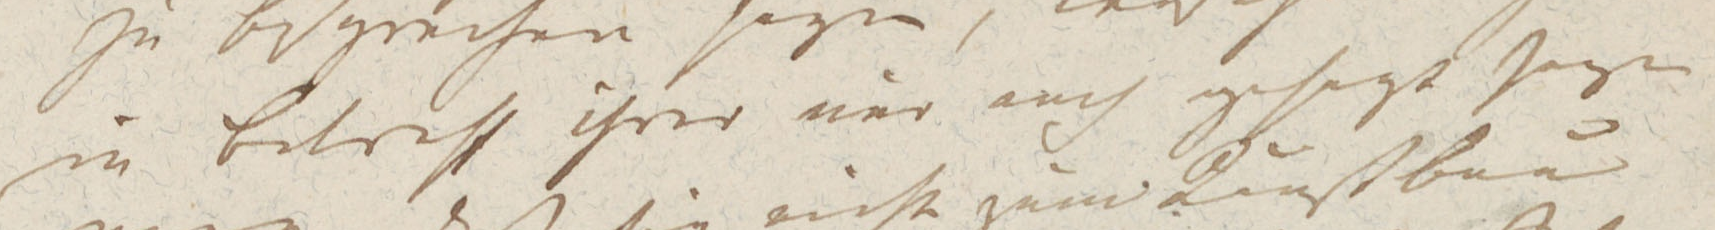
in Betreff ihrer nur noch gefragt seyn
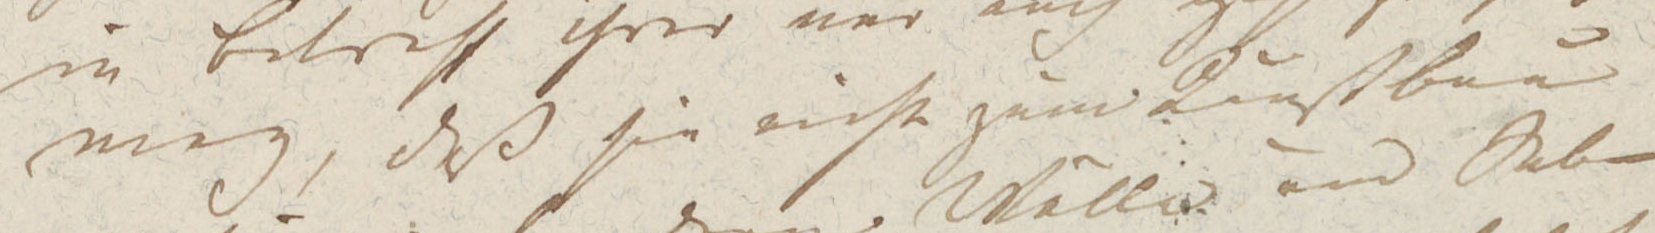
mag, dass sie nicht zum Kunstbau
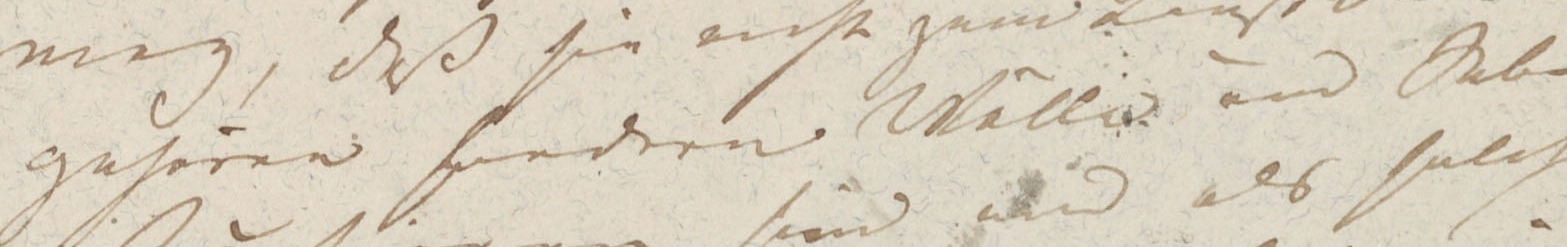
gehören sondern Wälle und Sub-
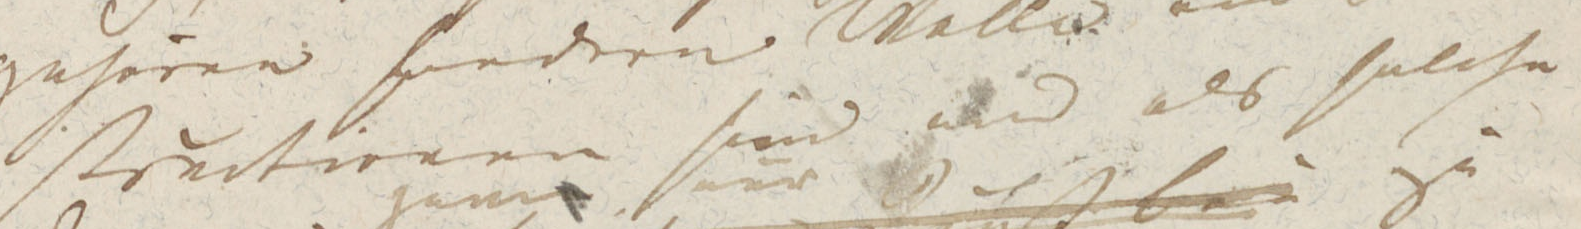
structionen sind und als solche
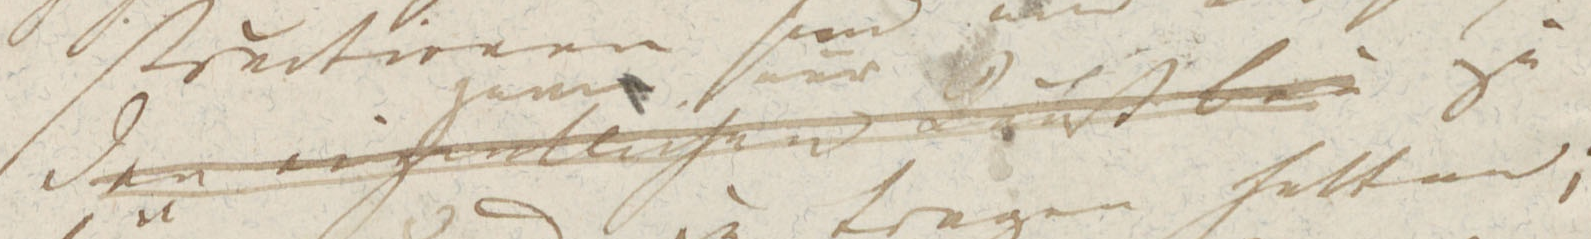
den eigentlichen Kunst bei zum
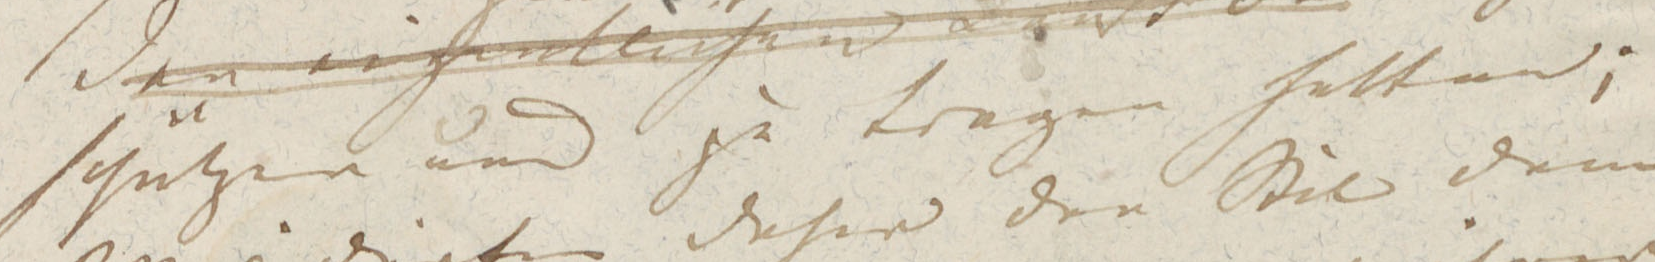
schützen und zu tragen hatten;
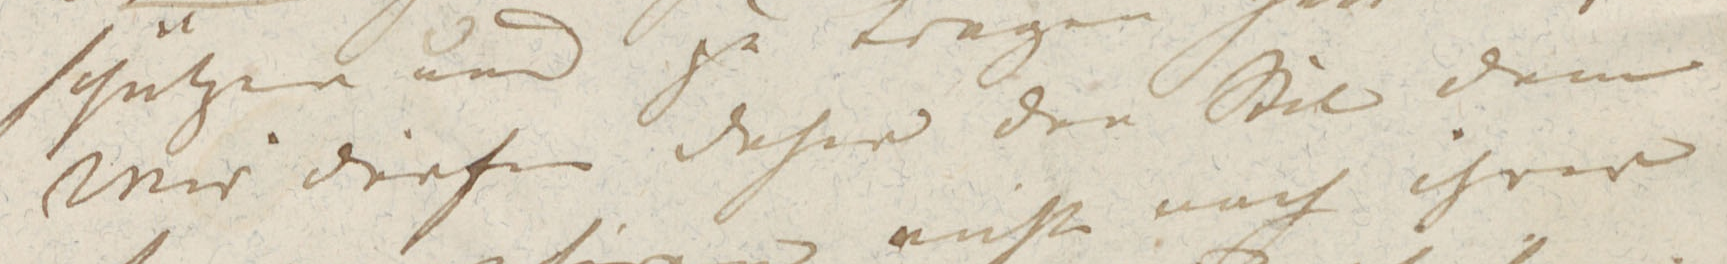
Wir dürfen daher den Stil dem
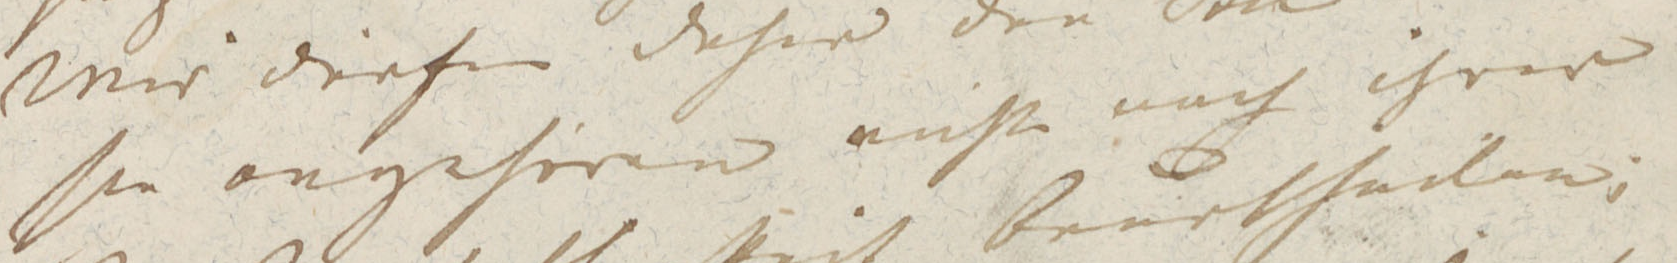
sie angehören nicht nach ihrer
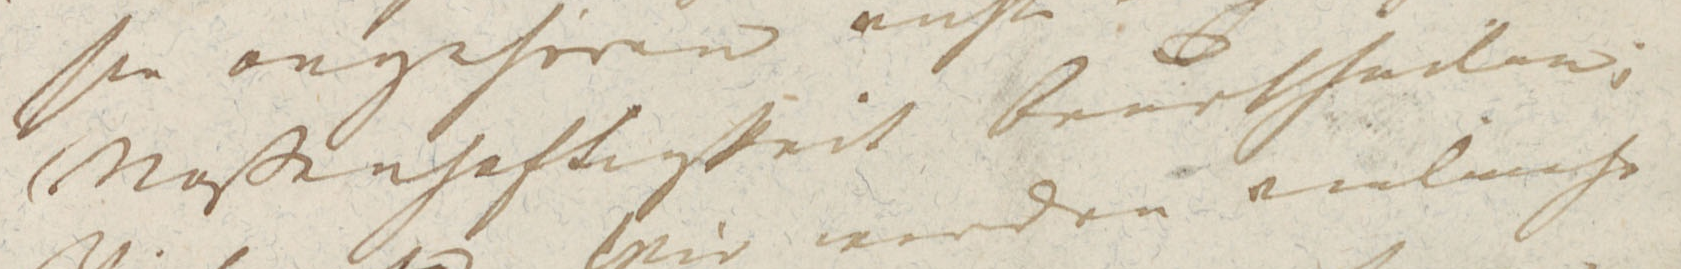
Massenhaftigkeit beurtheilen;
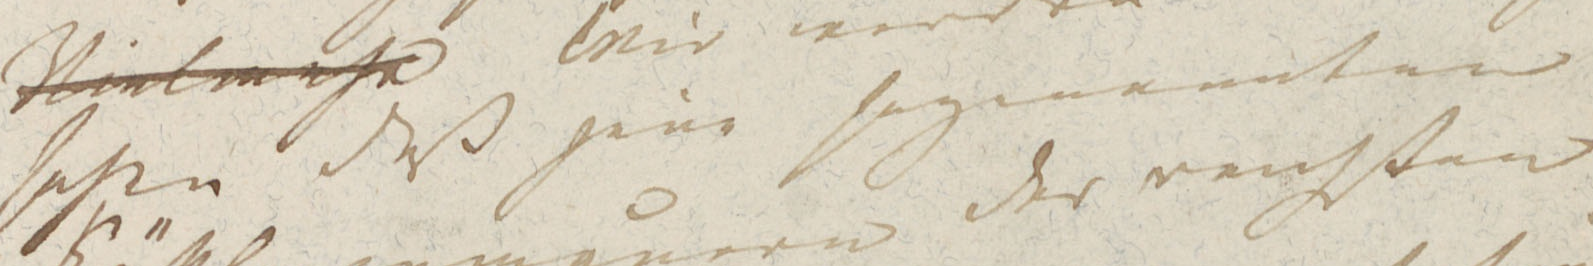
sehen dass jene sogenannten
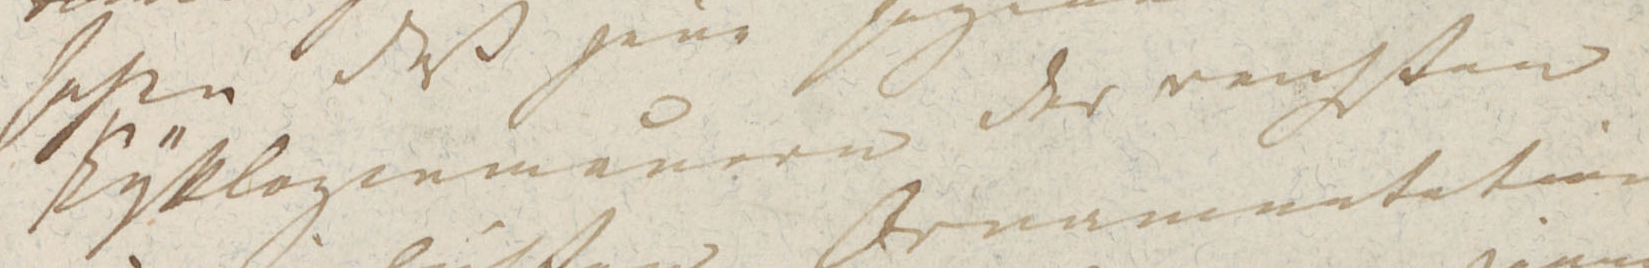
Kyklopenmauern der reichsten
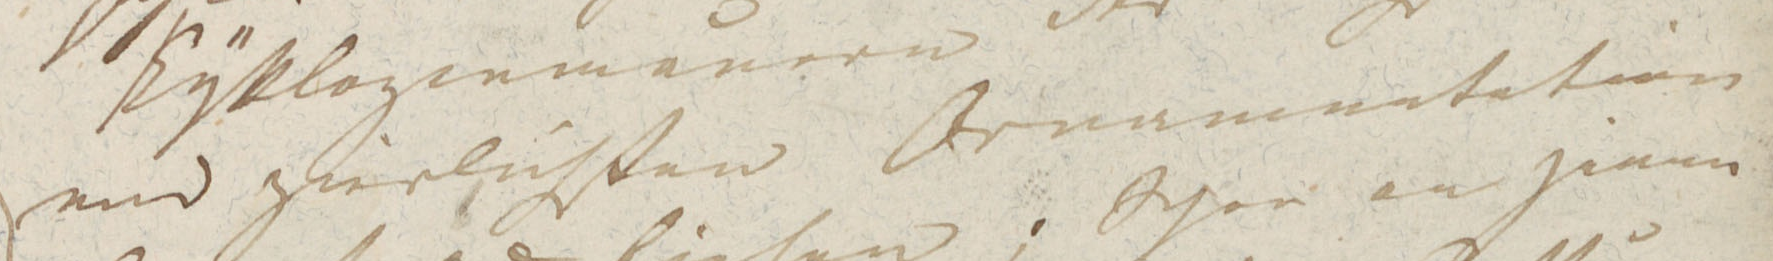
und zierlichsten Ornamentation
